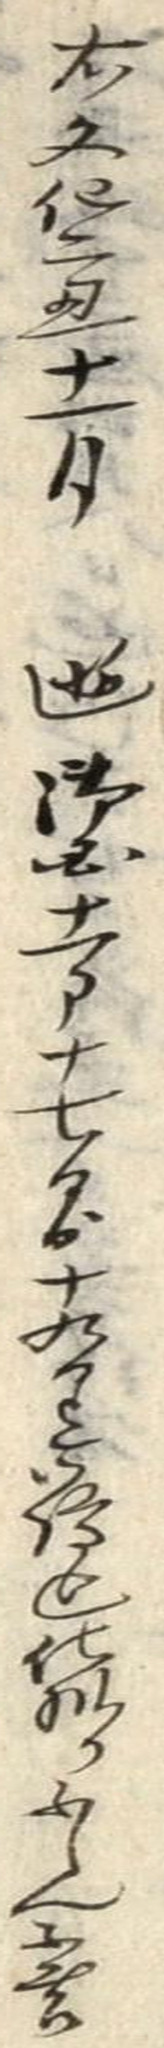右文化二丑十一月逝御国十一月十七日ゟ十九日迄御停止仕掛りふしん不苦
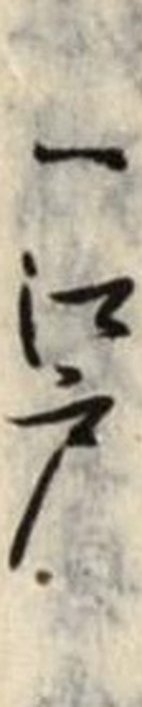一江戸
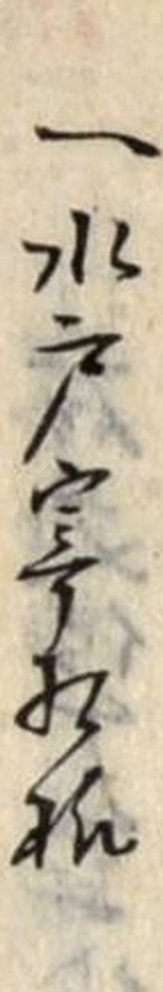一水戸宰相様

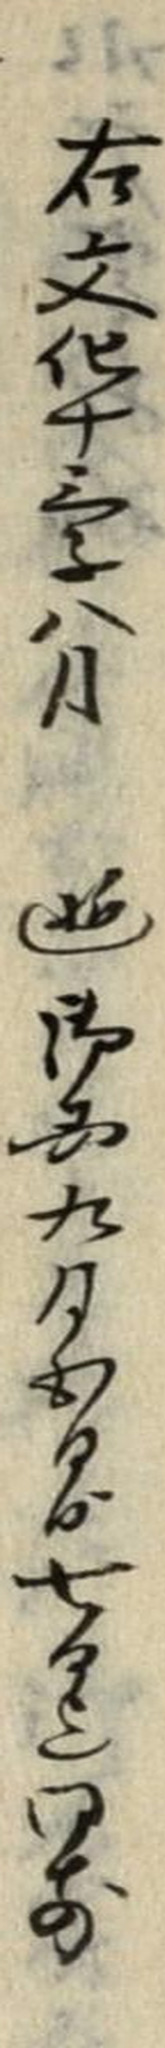右文化十三子八月逝御国九月五日ゟ七日迄同前
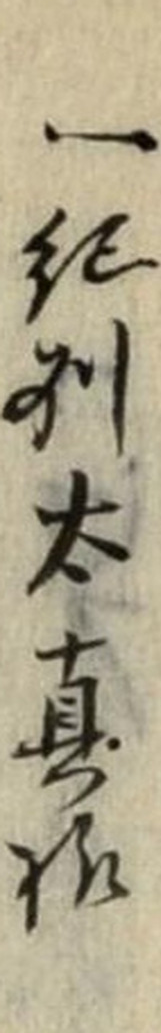一紀州太真様
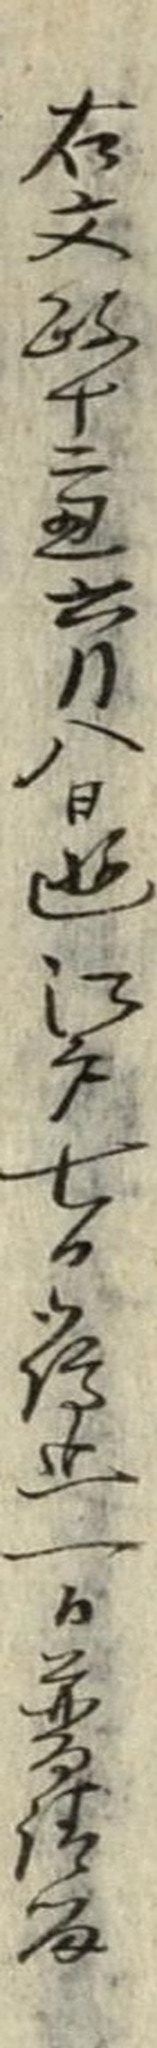右文政十二丑六月八日逝江戸七日御停止一日普請留
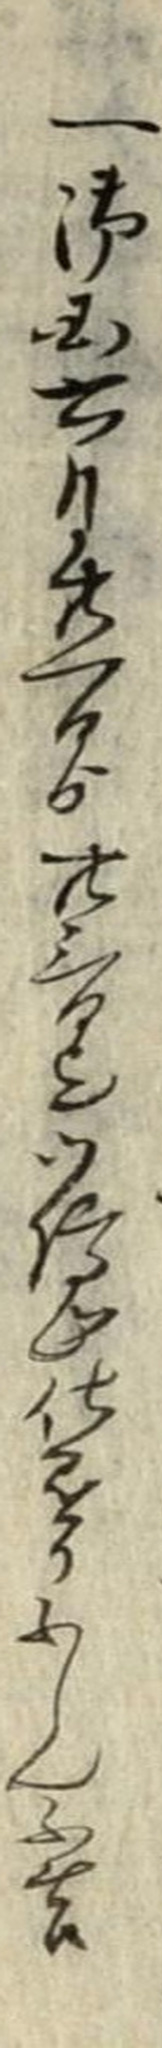一御国六月廿一日ゟ廿三日迄御停止仕懸りふしん不苦
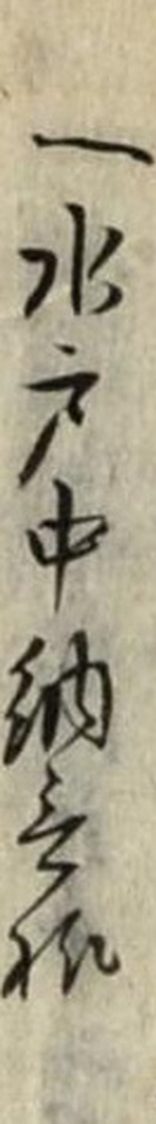一水戸中納言様
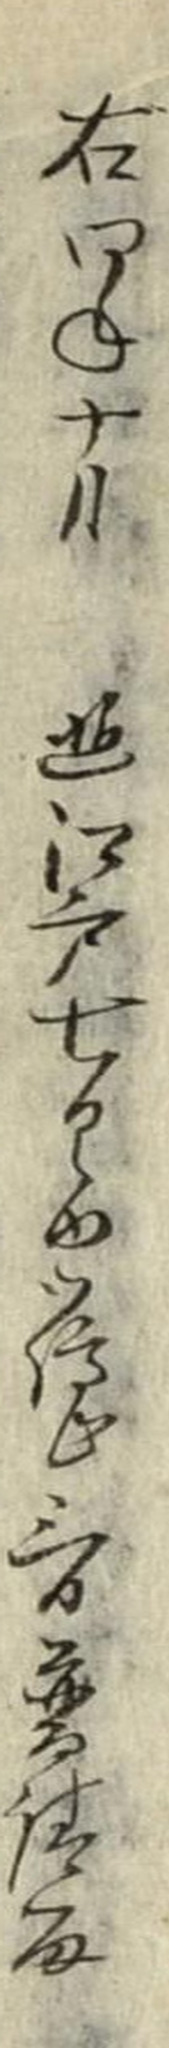右同年十月逝江戸七日之内御停止三日普請留
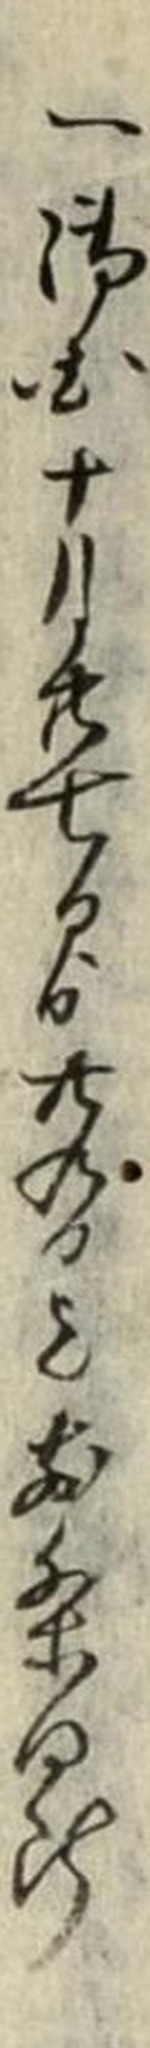一御国十月廿七日ゟ廿九日迄前条同断
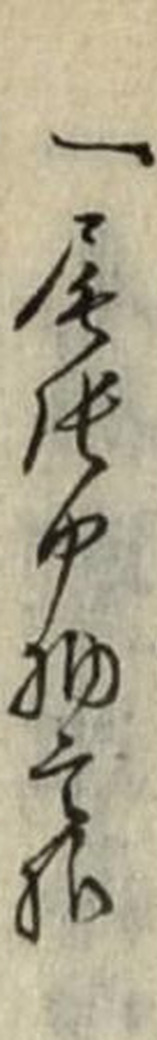一水戸中納言様
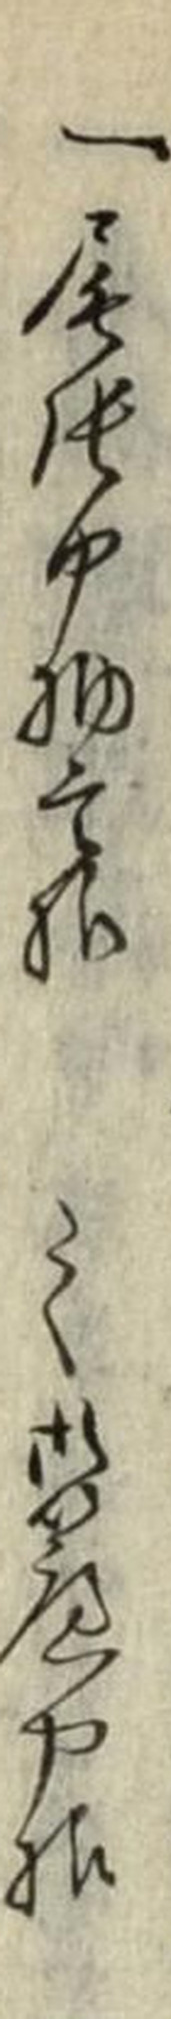一尾張中納言様之御簾中様
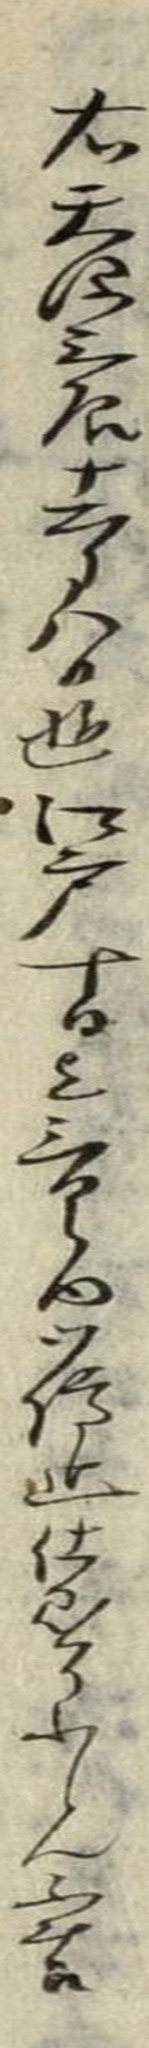右天保三辰十二月八日逝江戸十日迄三日之内御停止仕懸りふしん不苦
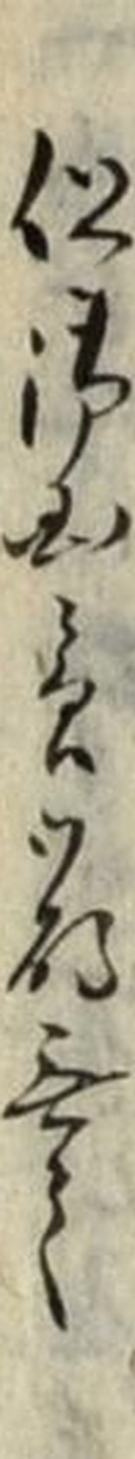但御国にては御触無之
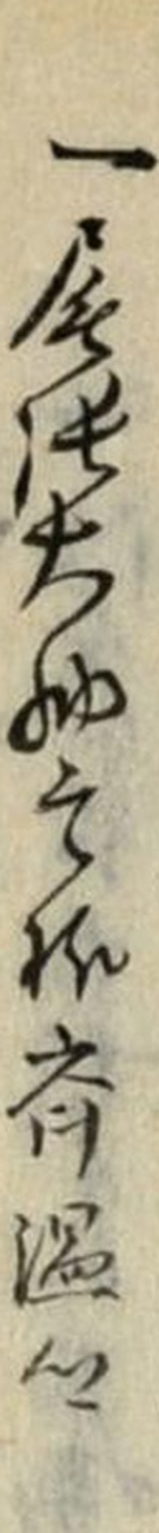一尾張大納言様斉温卿
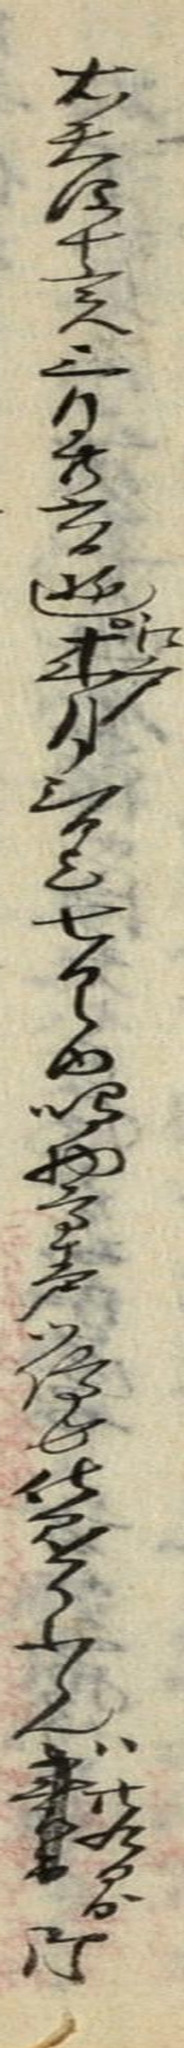右天保十亥三月廿六日逝◦江戸来月三日迄七日之内鳴物高声御停止仕懸りふしんは廿九日ゟ御
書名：御停止異変死失
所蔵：福井県文書館 Fukui Prefectural Archives
